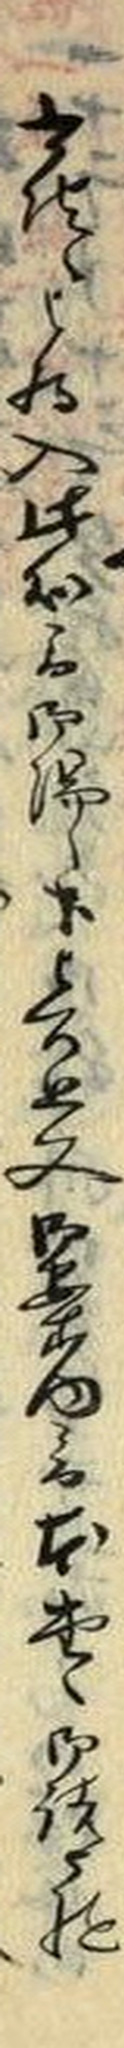書院へ被為入此処ニ而御湯之下被召上又御案内ニ而本堂へ御詰被遊
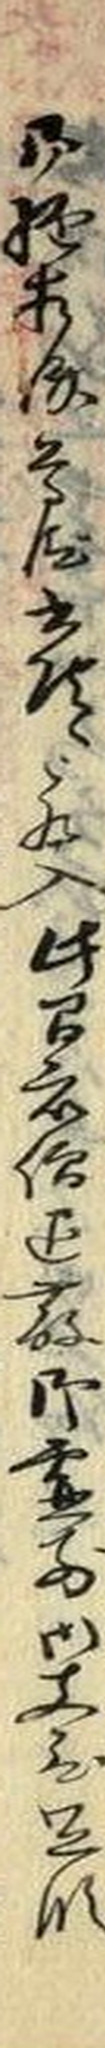御経相済鳥渡書院へ被為入此間衆僧退散御霊前御支度宜段
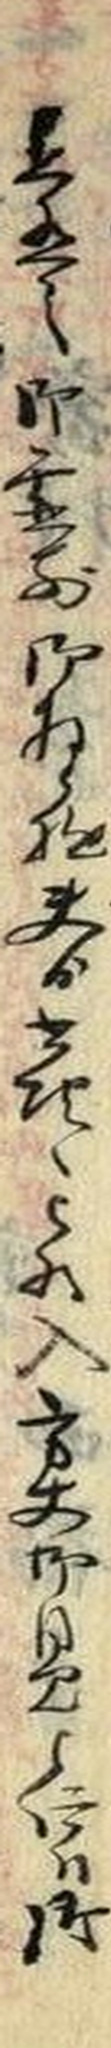申上有之御霊前御拝被遊夫ゟ書院へ被為入方丈御目見被仰付御
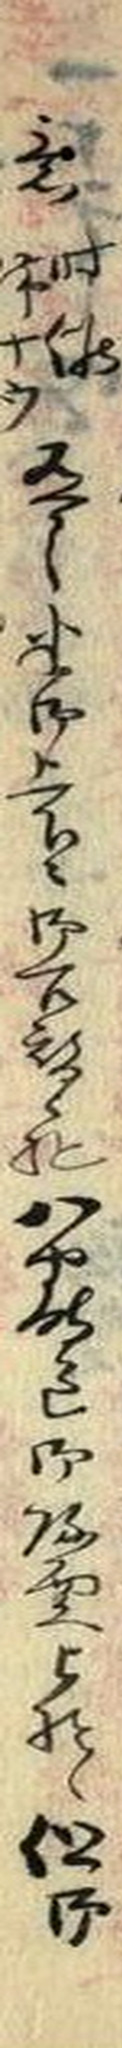滞ナウ有之半御上下ニ御召替被遊八半時過御帰殿被遊候但御
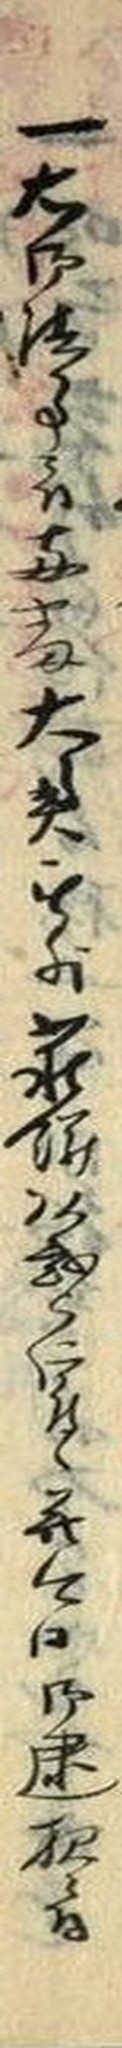一右御法事ニ付両番大奥其外荘餅頂戴被仰付候幷今日御逮夜ニ付
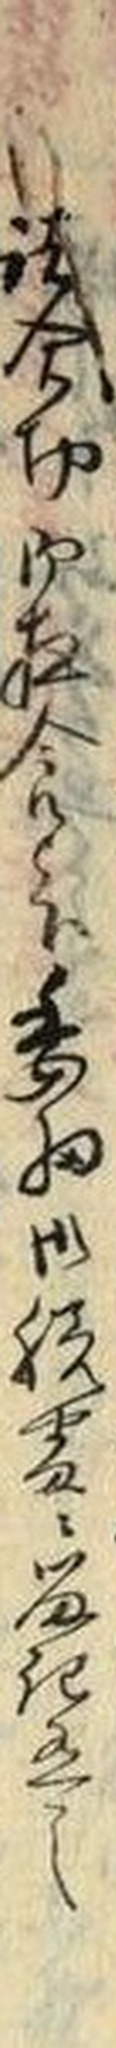詰合切御夜食被下委細御膳番ニ留記有之
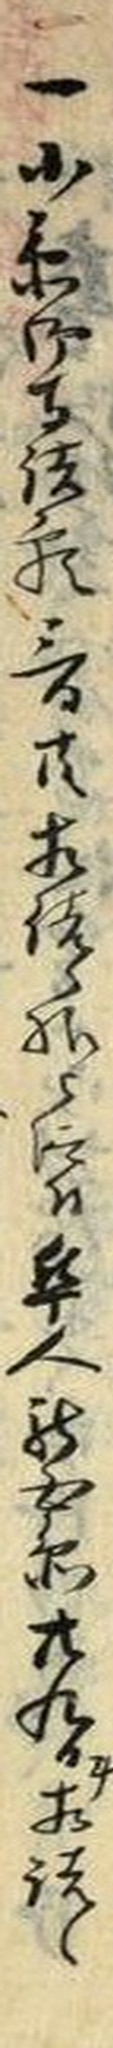一小兵衛御寺詰願三日共相詰候様被仰付隼人新五兵衛廿九日斗相詰候
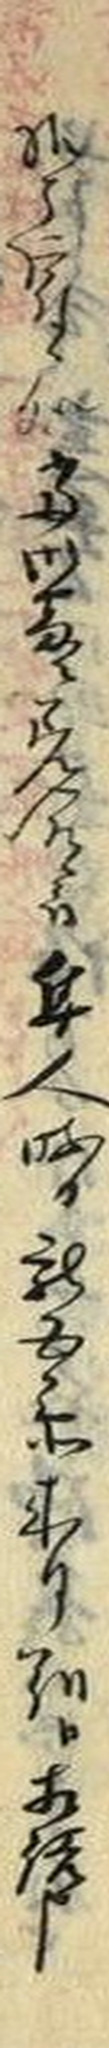様被仰付候処当御番ニ差合候ニ付隼人晦日新五兵衛来月朔日相詰申
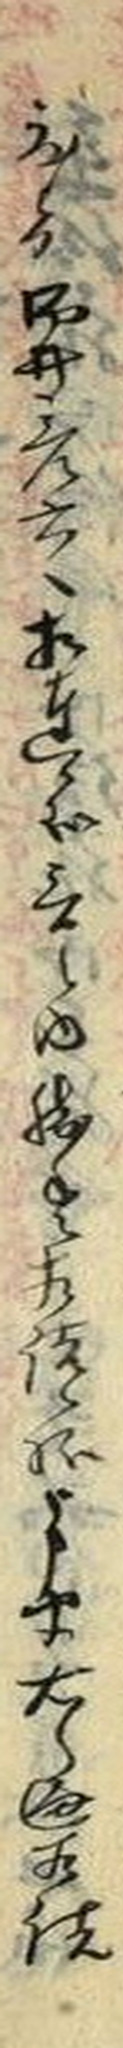度旨酒井彦六へ相達候処三日之内勝手ニ相詰候様被申聞右之通相詰

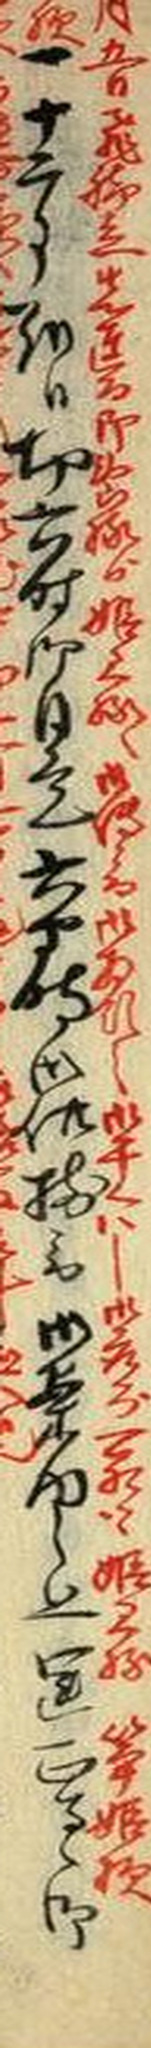一十二月朔日切六時御目覚六半時御供揃ニ而御案内之上運正寺へ御
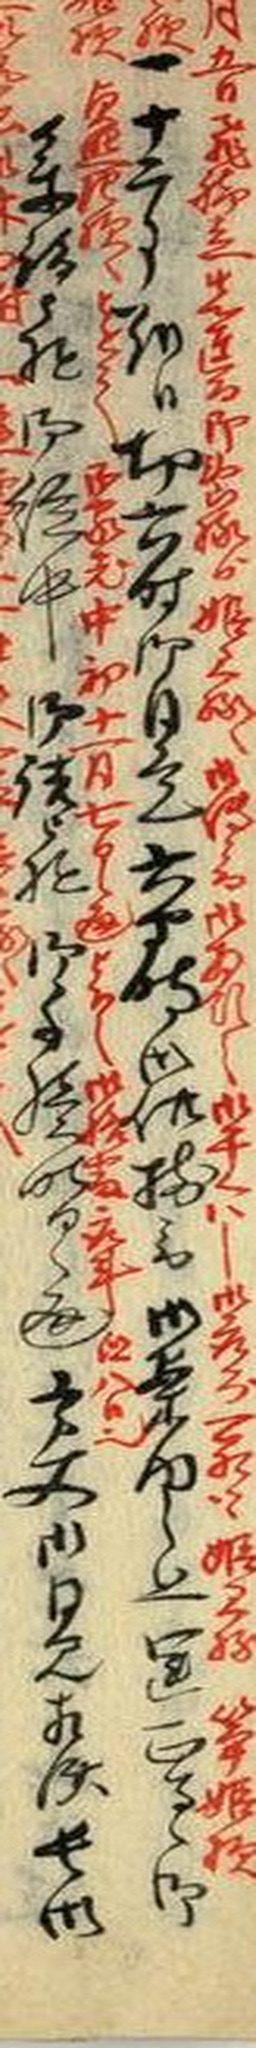参詣被遊御経中御詰被遊御手続昨日之通方丈御目見相済長御
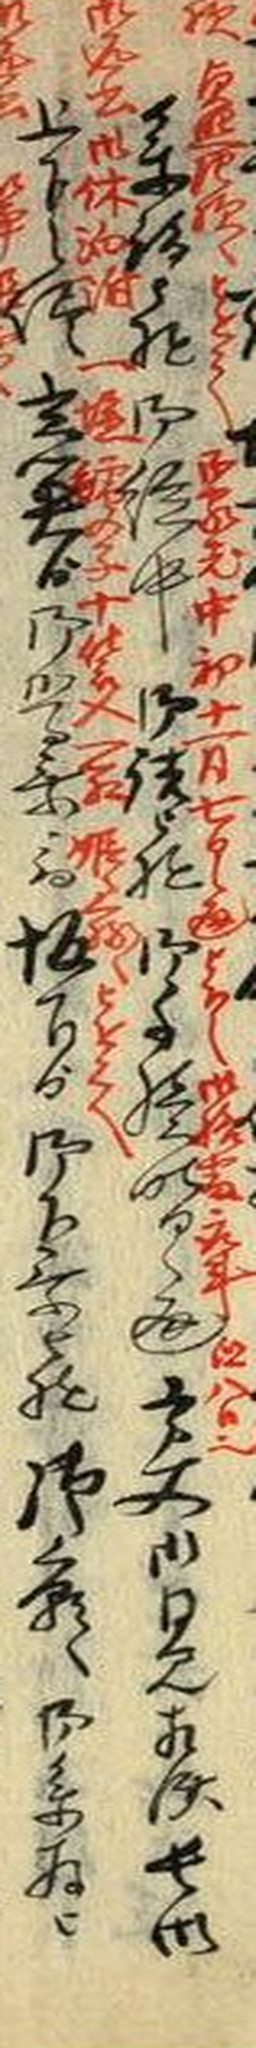上下之儘玄関ゟ御駕乗ニ而坂下ゟ御下乗被遊御廟へ御参拝被
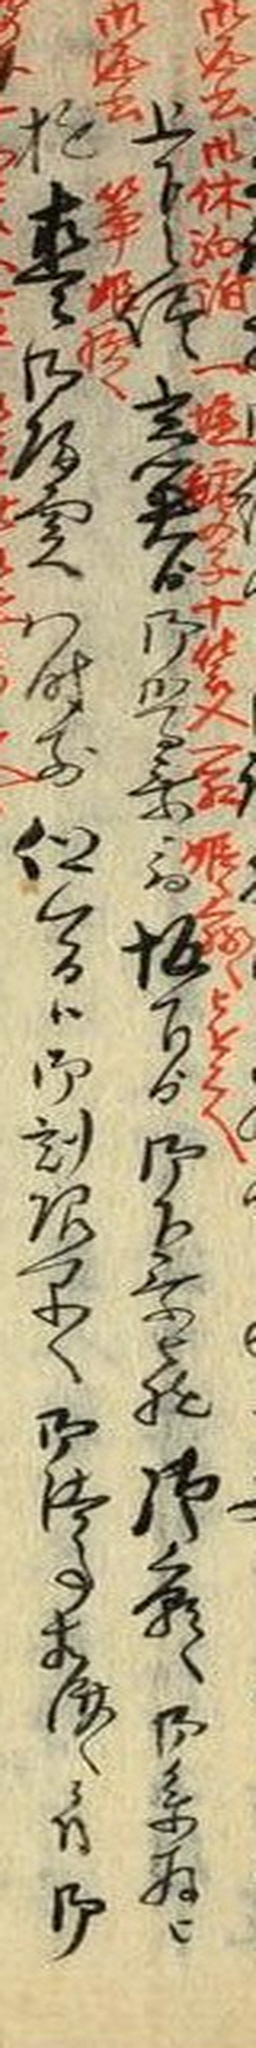遊直ニ御帰殿八時前但今日ハ御刻限早く御法事相済候ニ付御
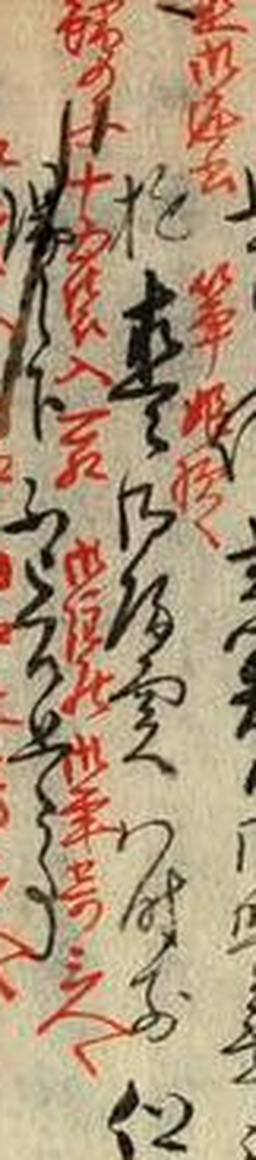湯之下不被召上候事
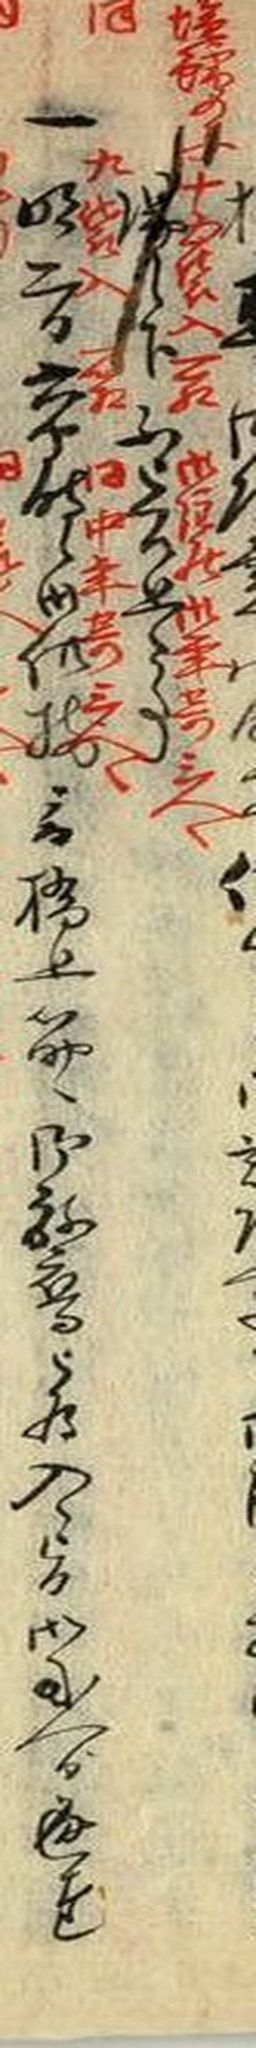一明二日六半時御供揃ニ而橋上筋へ御放鷹被為入候旨御用人ゟ通達
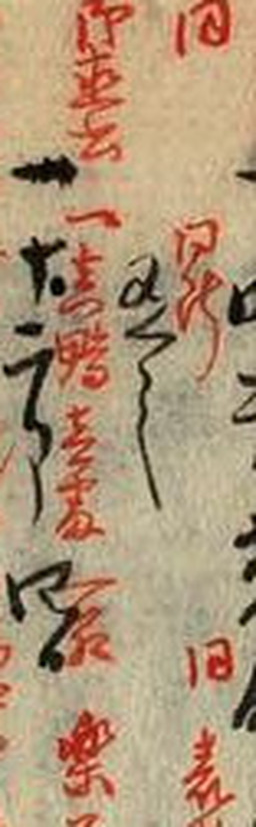一十二月四日
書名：少傅日録抄（斉承付側向頭取日記、在国）
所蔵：福井県文書館 Fukui Prefectural Archives
